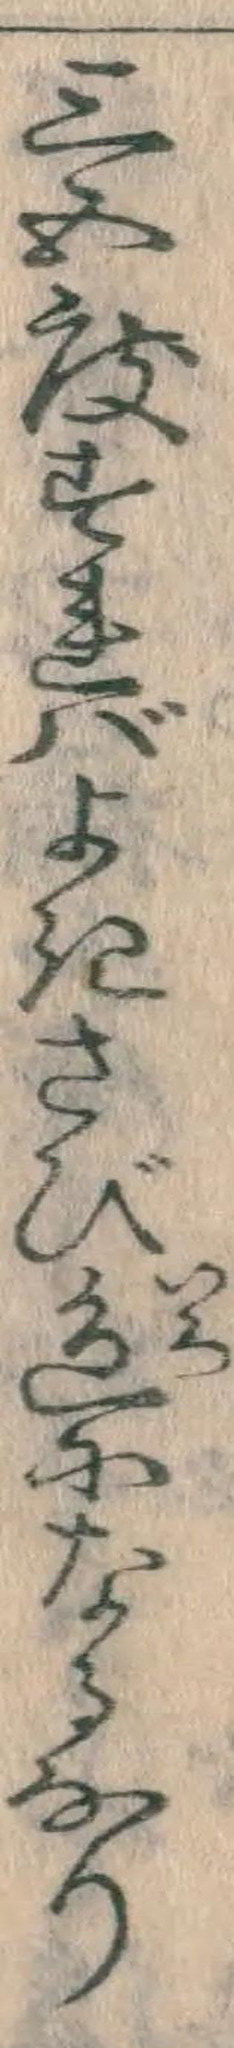三五度すればよきさび色になるなり
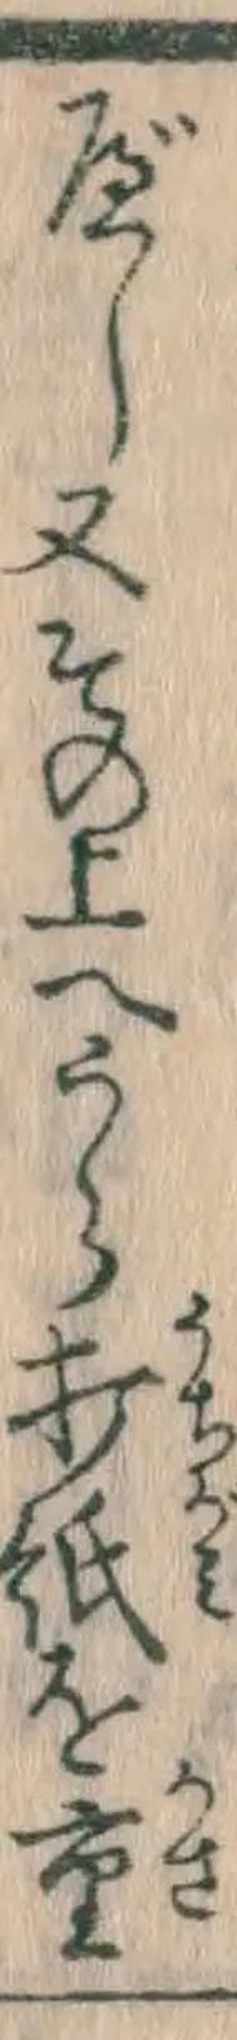べし又その上へうら打紙を重
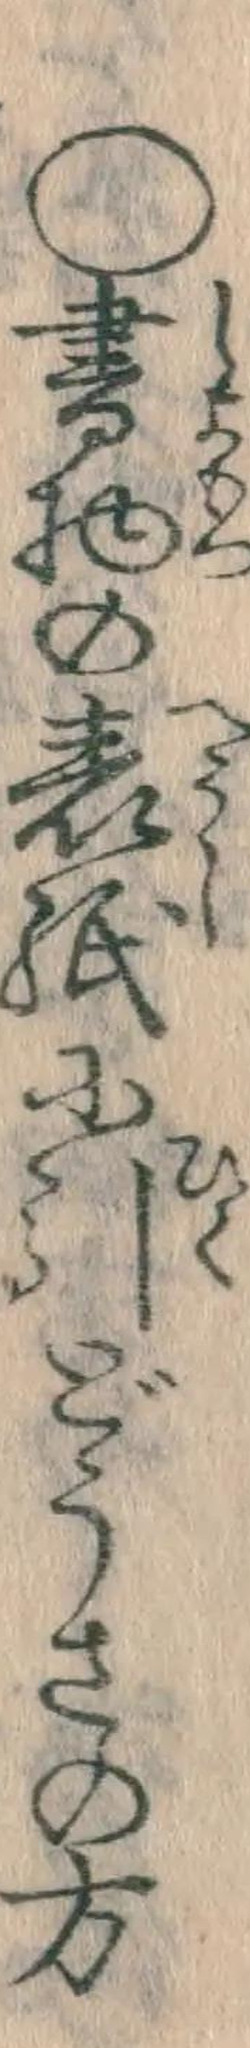○書物の表紙に引どうさの方
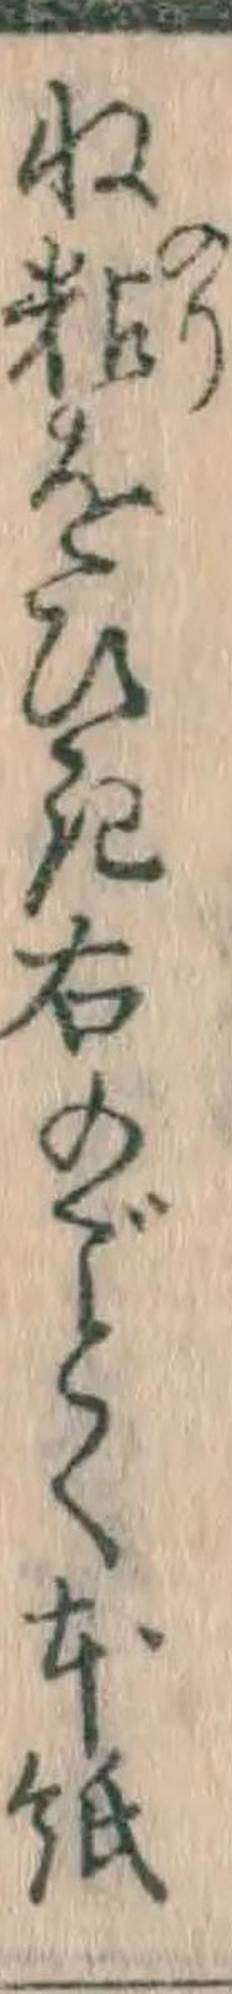ね粘をひき右のごとく本紙
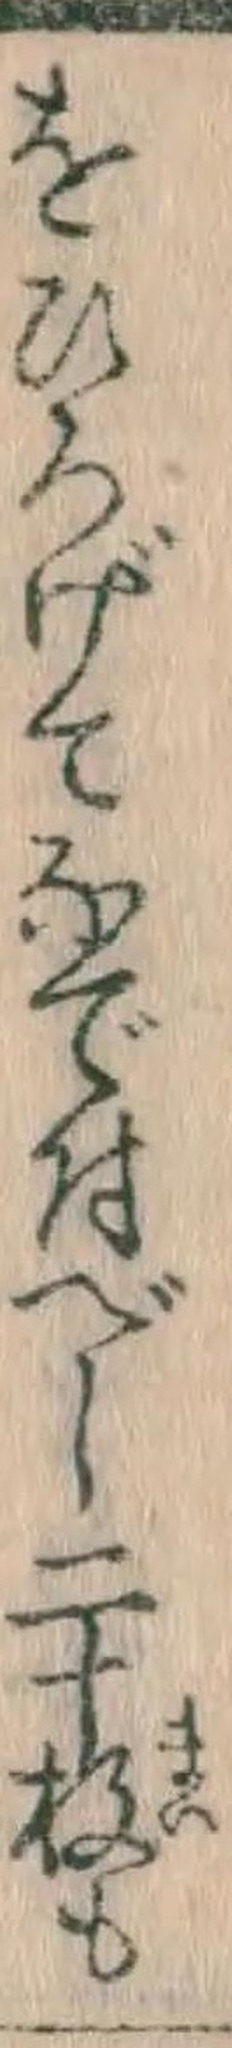をひろげてなで付べし二十枚も
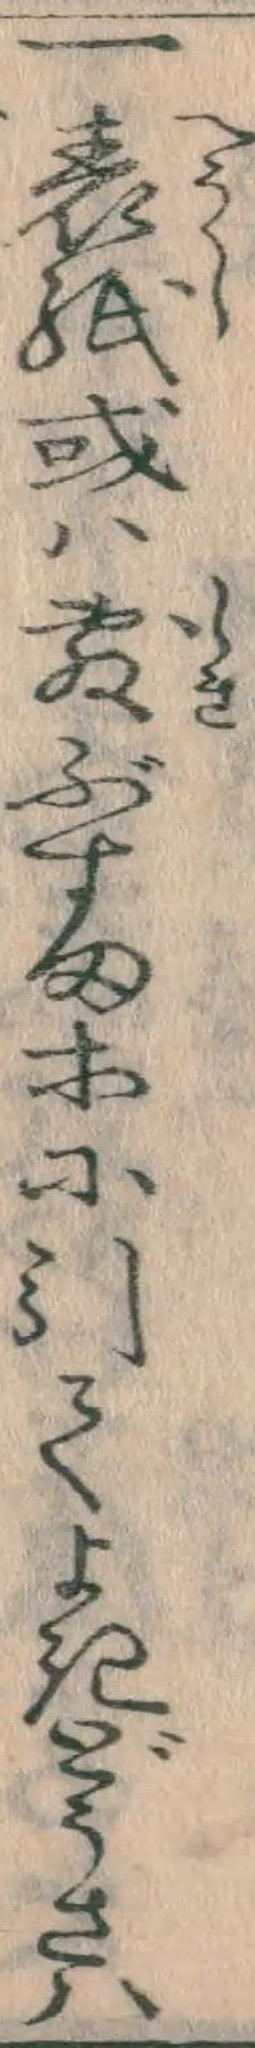一表紙或は敷ぶすま等に引てよきどうさは
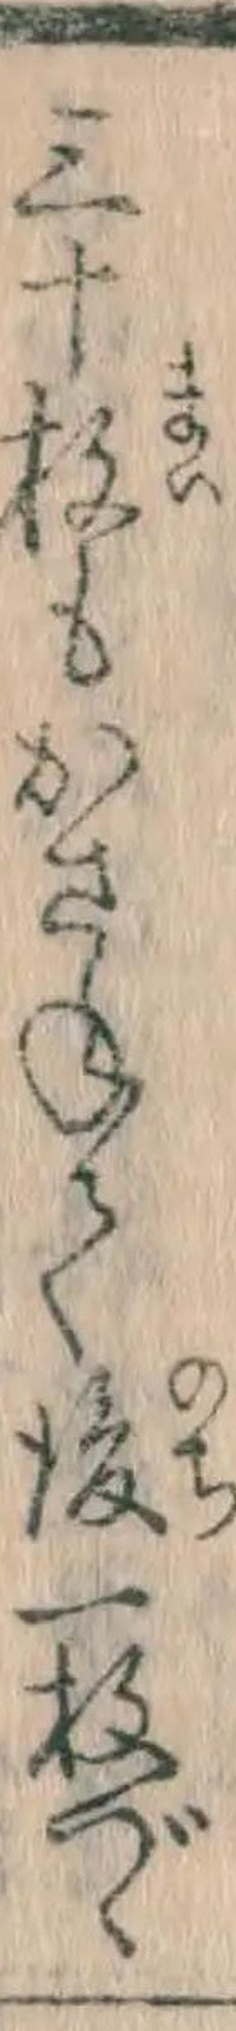三十枚もかさねて後一枚づゝ
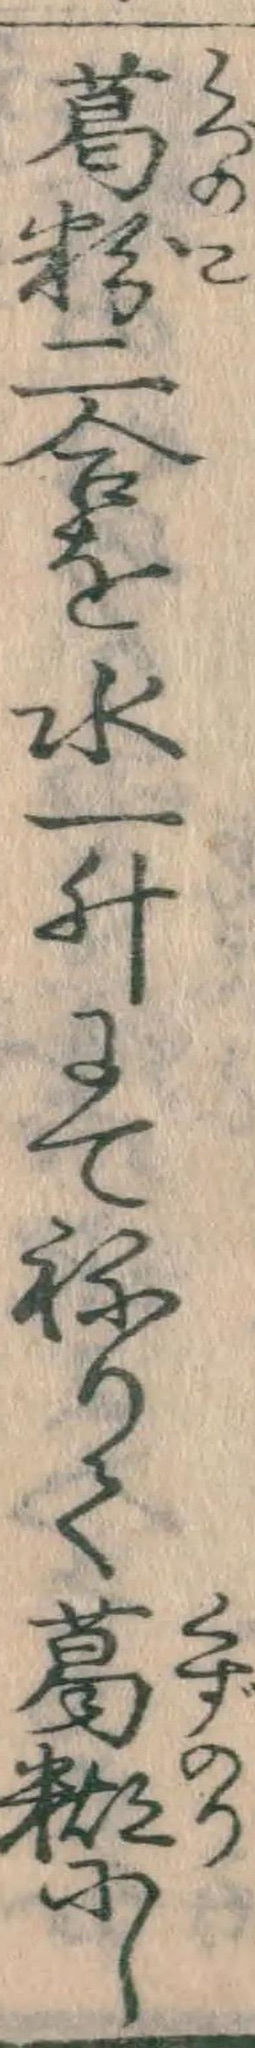葛粉二合を水一升にてねりて葛糊にし
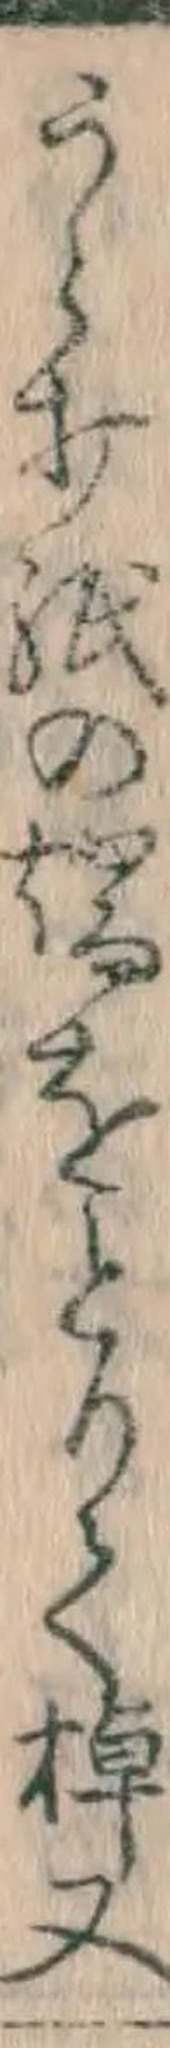うら打紙の端をとりて棹又
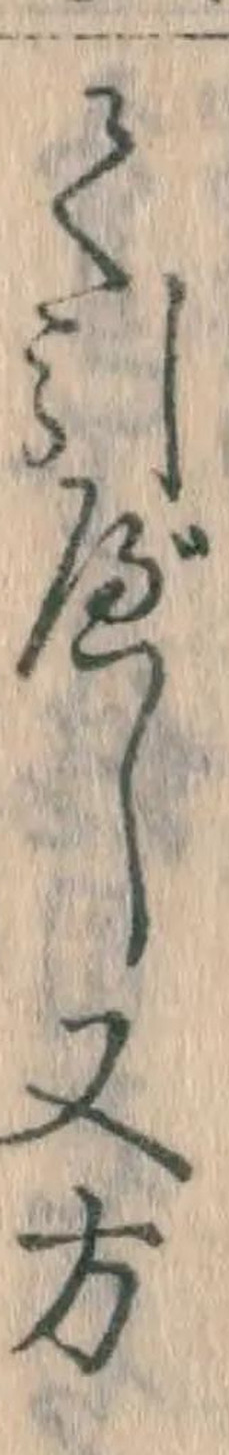て引べし又方
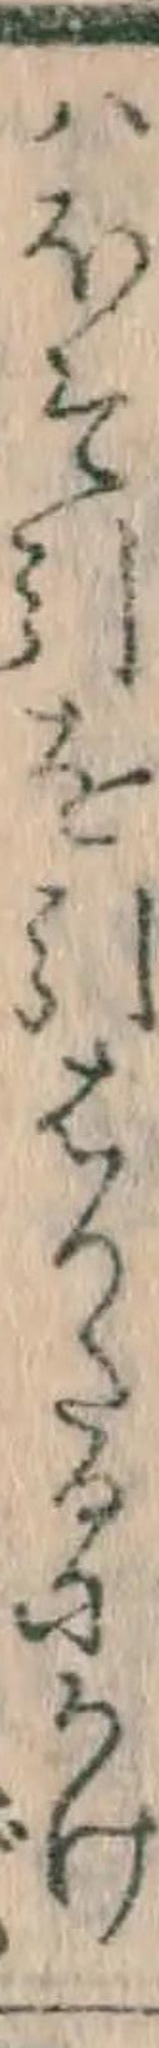はほそ引を引はりたるにかけ
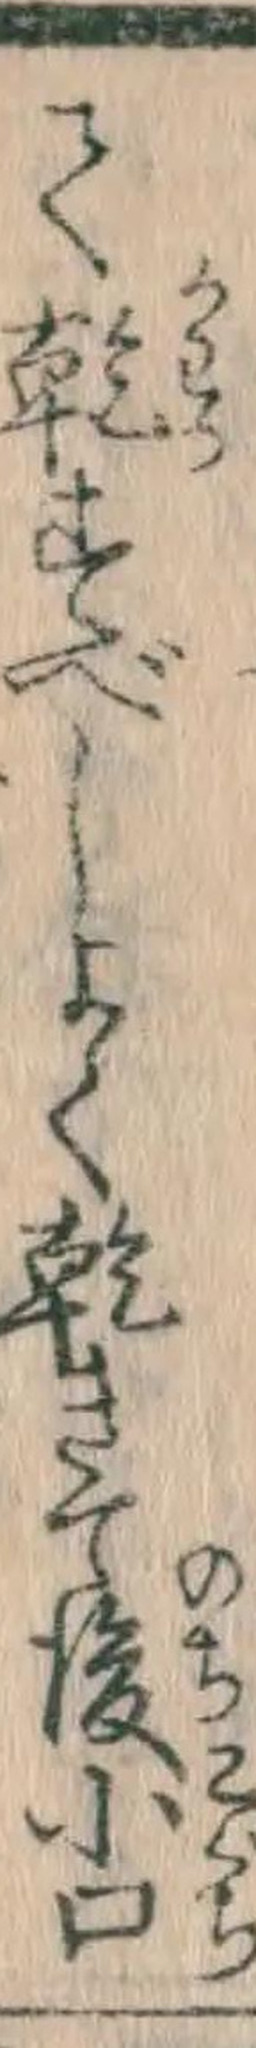て乾すべしよく乾きて後小口
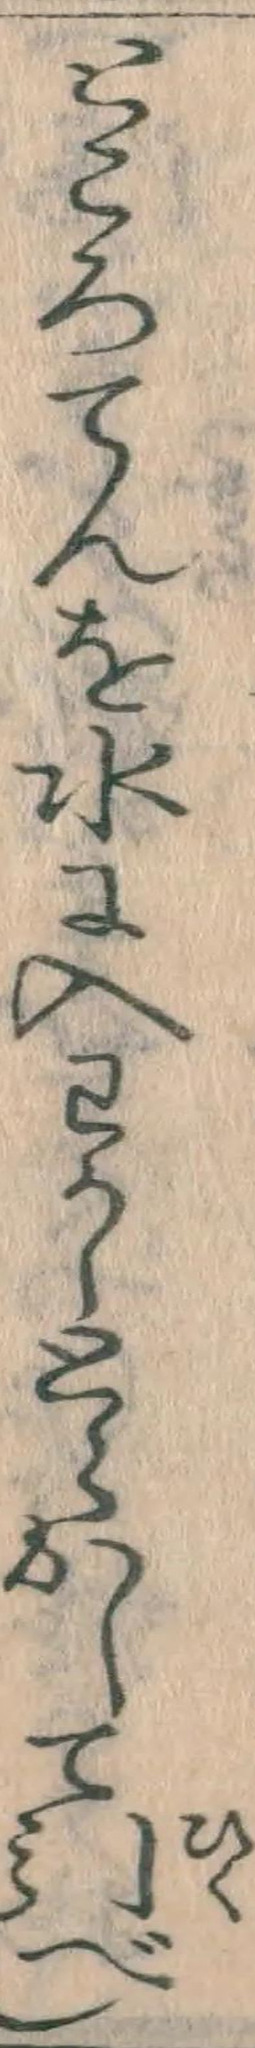ところてんを水に入わかしとらかして引べし
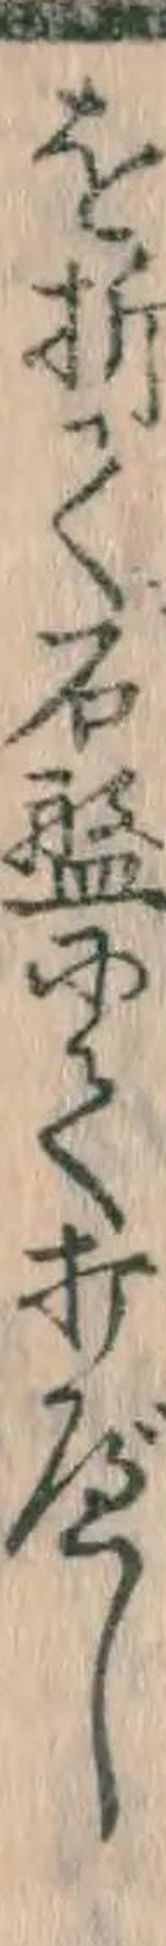を折て石盤にて打べし
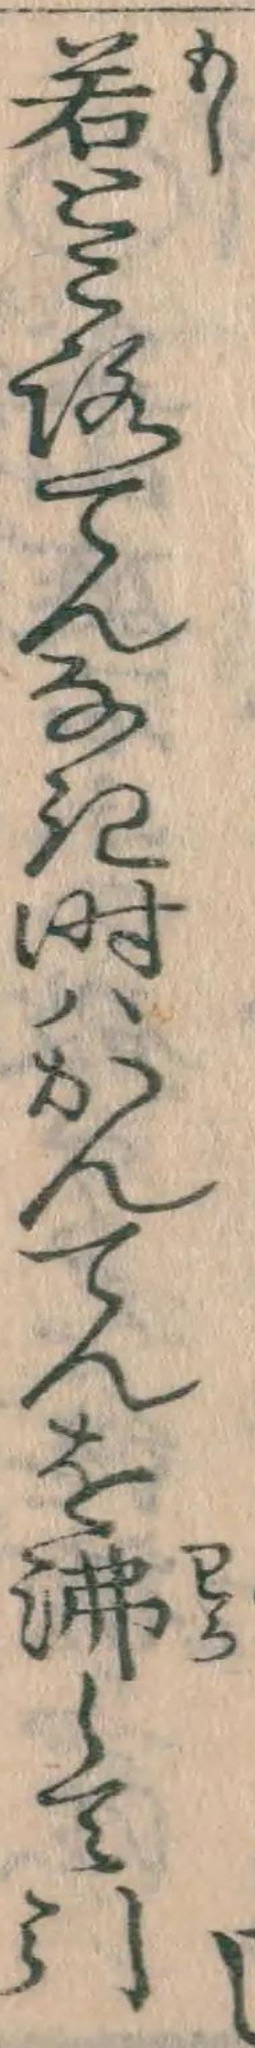若ところてんなき時はかんてんを沸して引
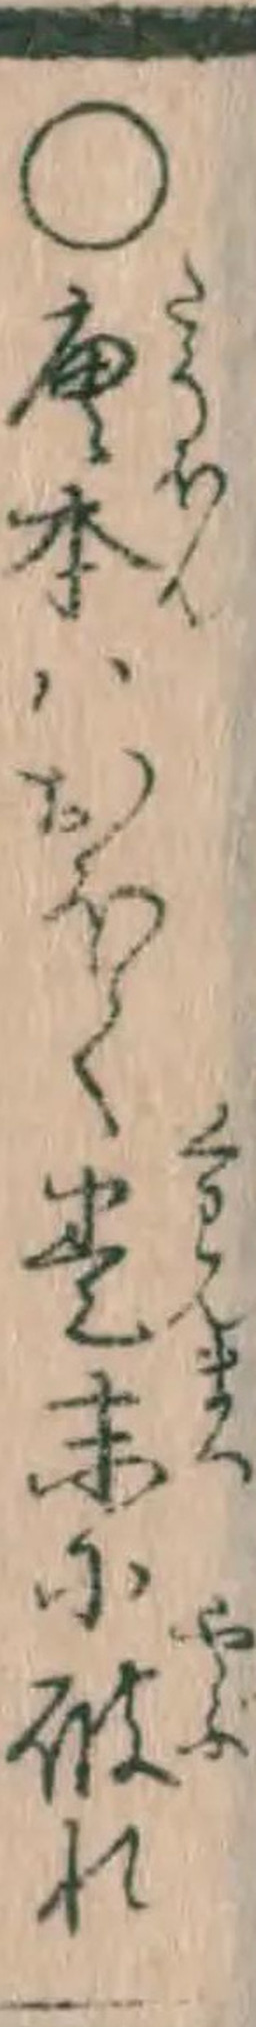○唐本はおほく巻末に破れ
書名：広益秘事大全 3巻. [2]
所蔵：国立国会図書館 National Diet Library, JAPAN
